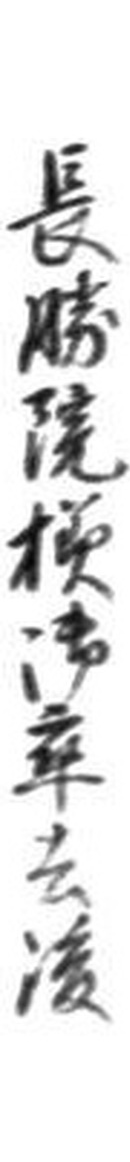長勝院様御卒去後
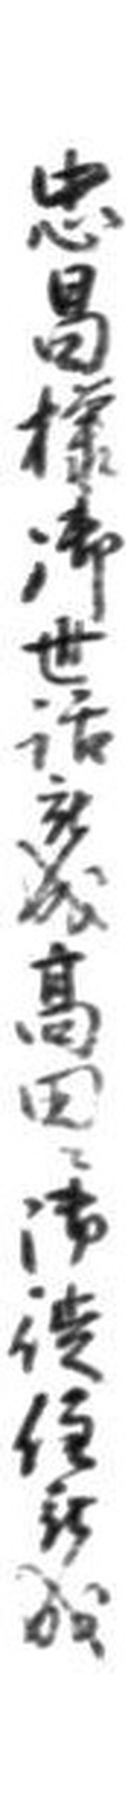忠昌様御世話被成高田ニ御徙住被成
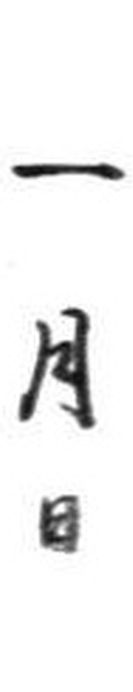一月日
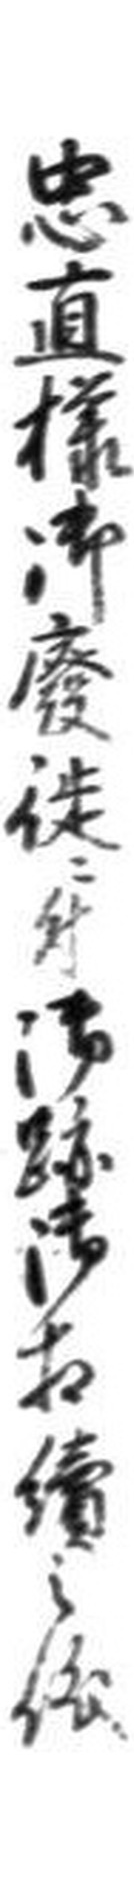忠直様御廃徙ニ付御跡御相続之儀
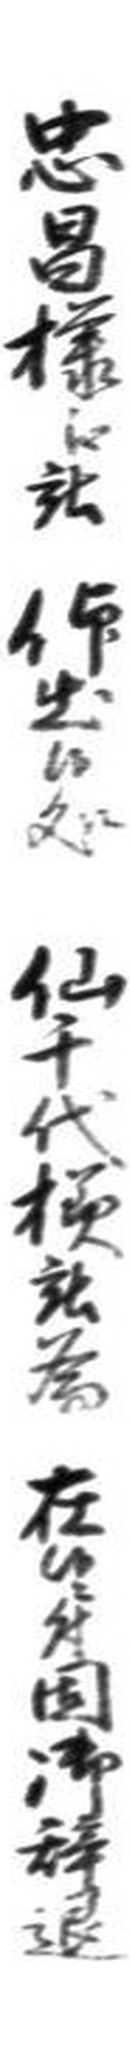忠昌様江被仰出候処仙千代様被為在候ニ付固御辞退

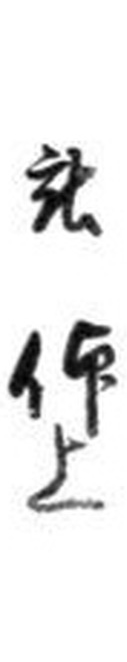被仰上
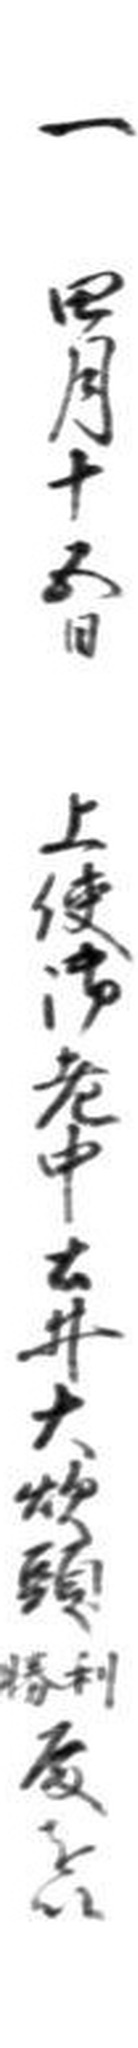一四月十五日上使御老中土井大炊頭利勝殿を以
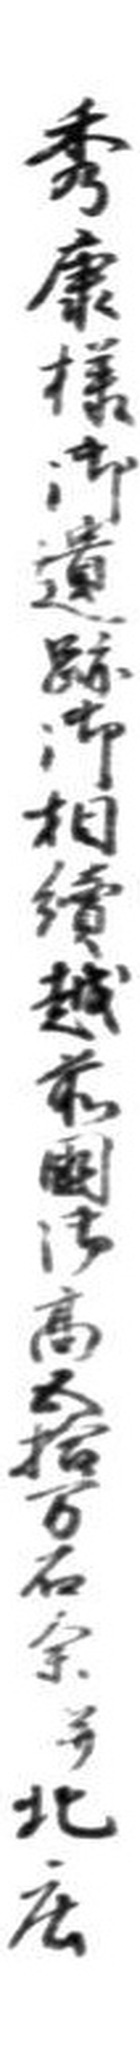秀康様御遺跡御相続越前国御高五拾万石余并北庄
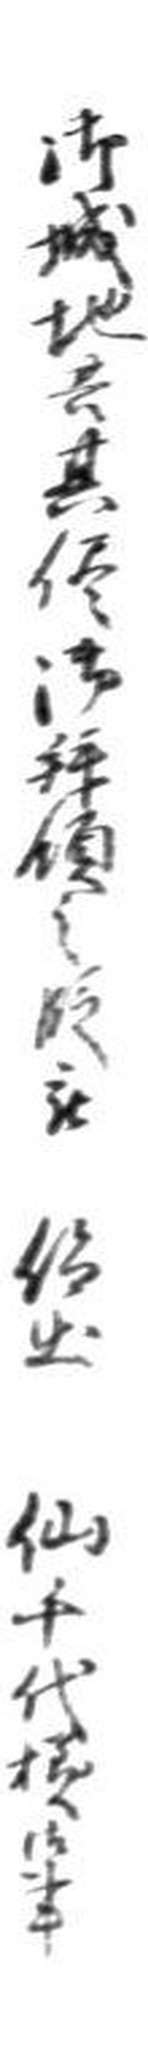御城地共其侭御拝領之段被仰出仙千代様御事
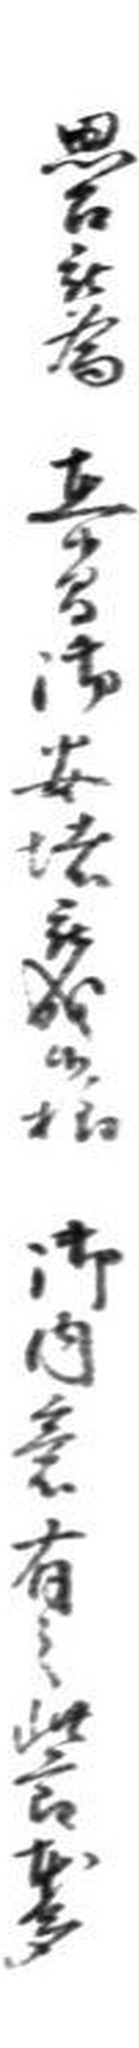思召被為在候間御安堵被成候様御内意有之此節本多
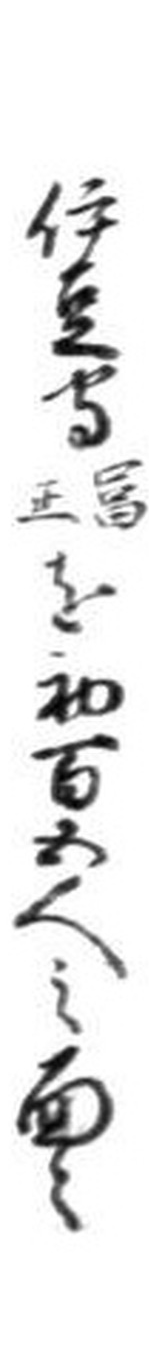伊豆守冨正を初百五人之面々

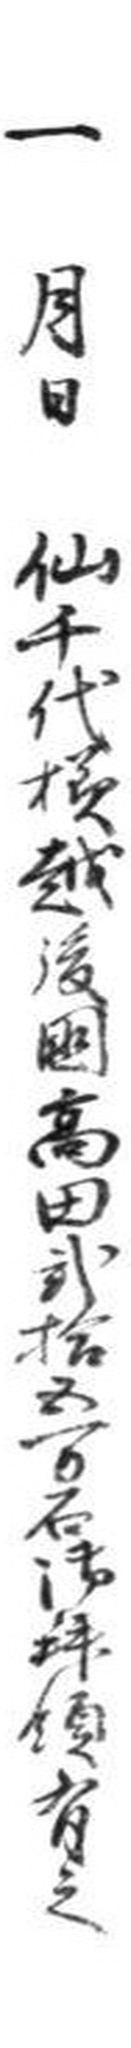一月日仙千代様越後国高田弐拾五万石御拝領有之
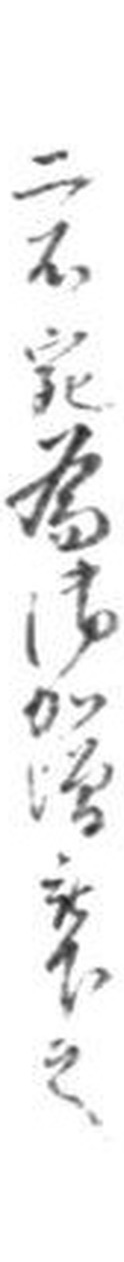二石宛為御加増被下之
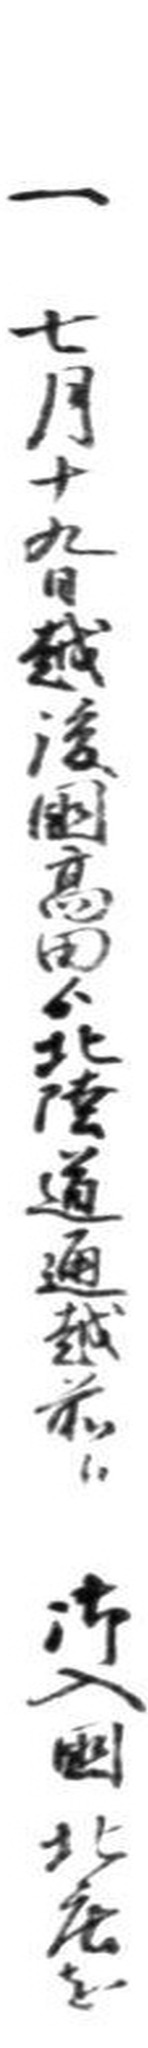一七月十九日越後国高田ゟ北陸道通越前江御入国北庄を
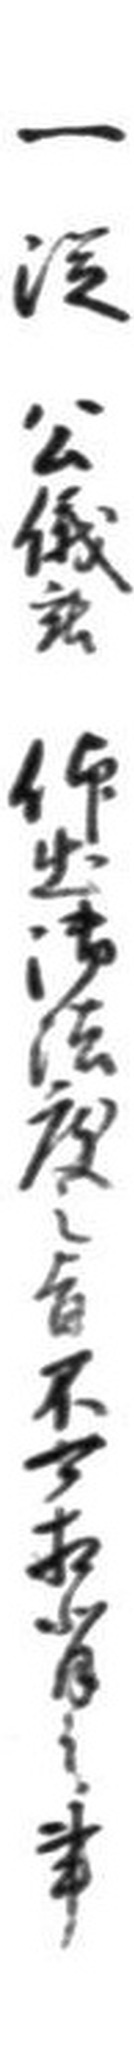一従公儀被仰出御法度之旨不可相背之事
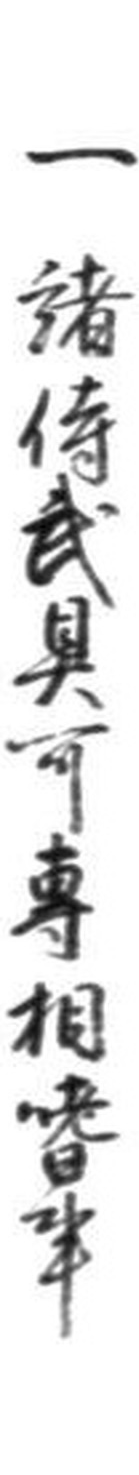一諸侍武具可専相嗜事
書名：家譜 三 忠昌公 従慶長八年到寛永六年
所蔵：福井県文書館 Fukui Prefectural Archives
